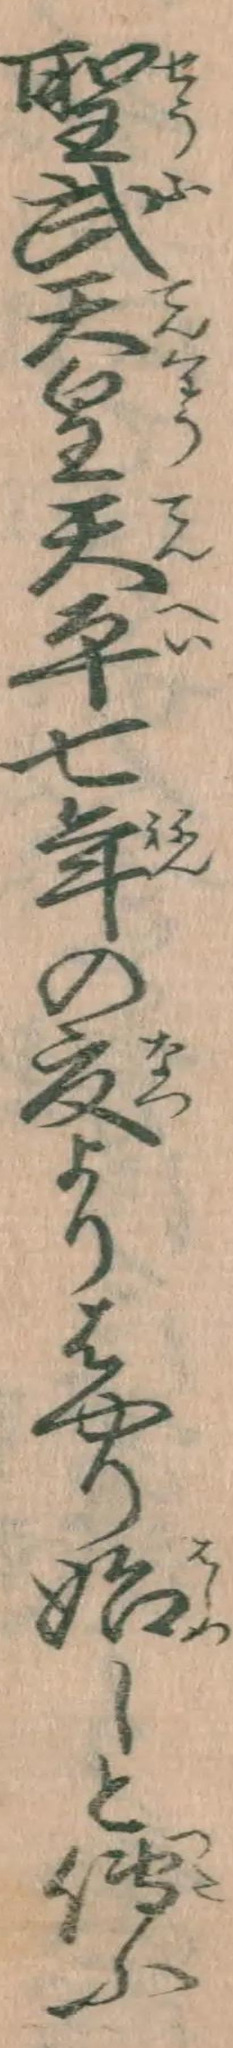聖武天皇天平七年の夏よりはやり始しと伝ふ
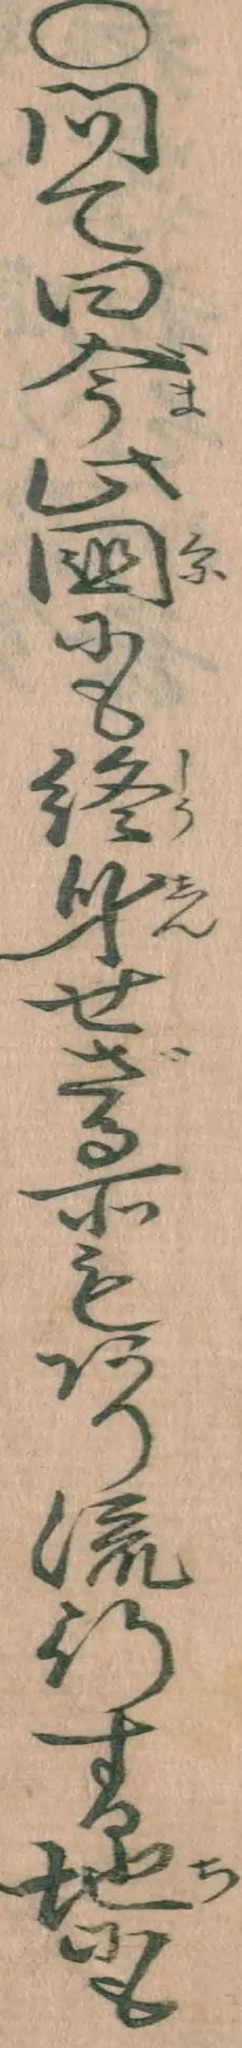○問て曰今此国にも終身せざる所もあり流行する地にも
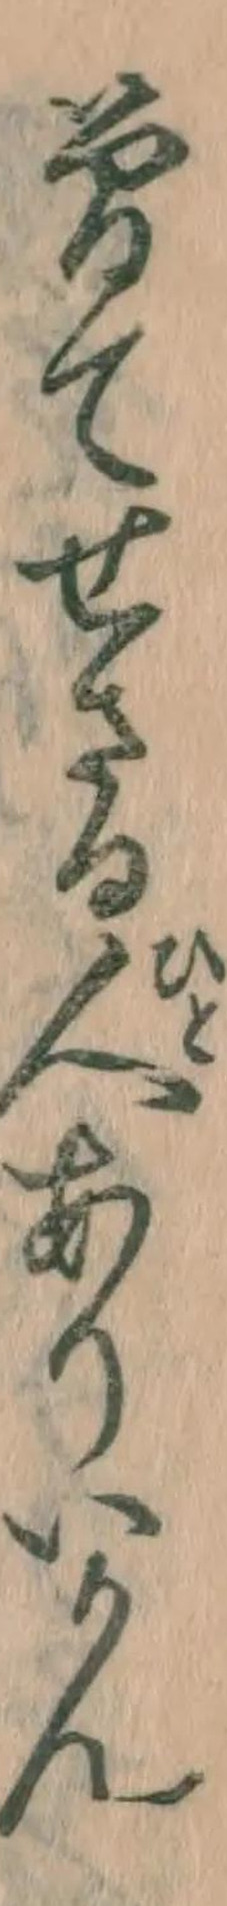曽てせさる人ありいかん
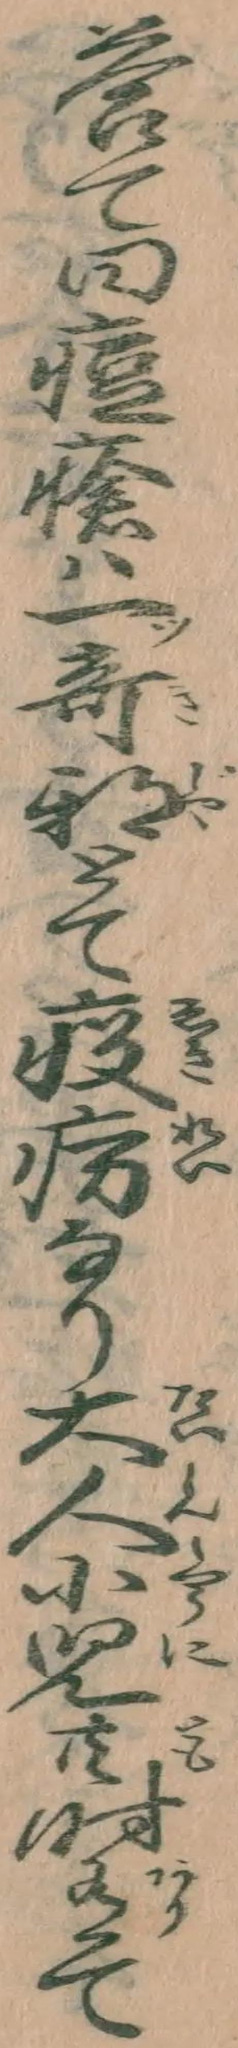答て曰痘瘡は一ッ奇邪とて疫癘なり大人小児共時有て
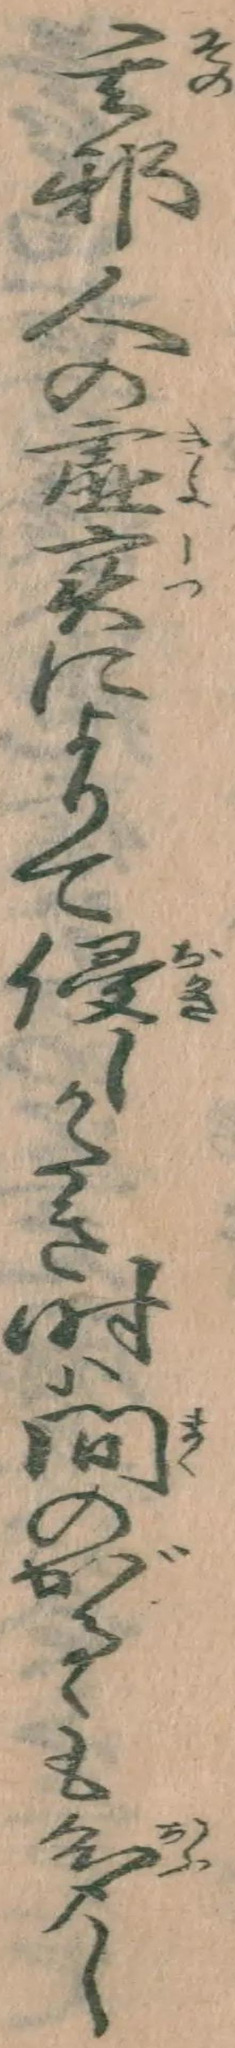其邪人の虚実によりて侵しかたき時は間のがるゝも多し
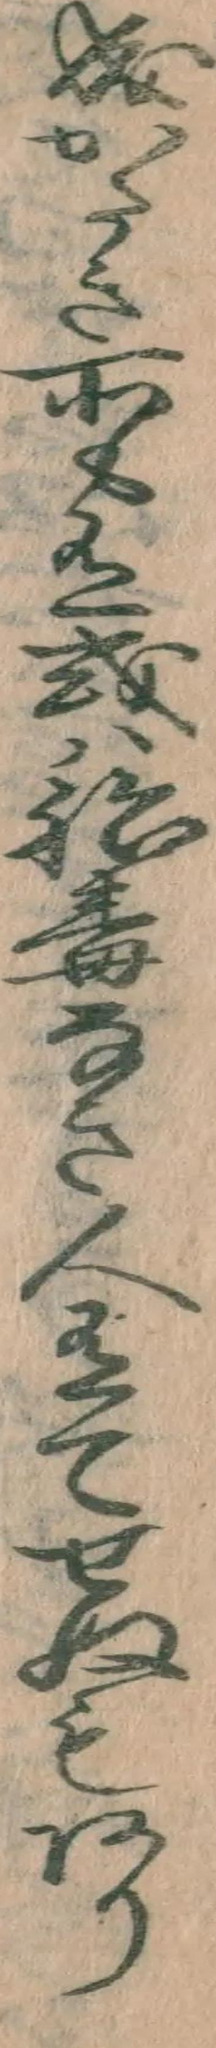成かたき所も有或は胎毒なき人有てせぬもあり
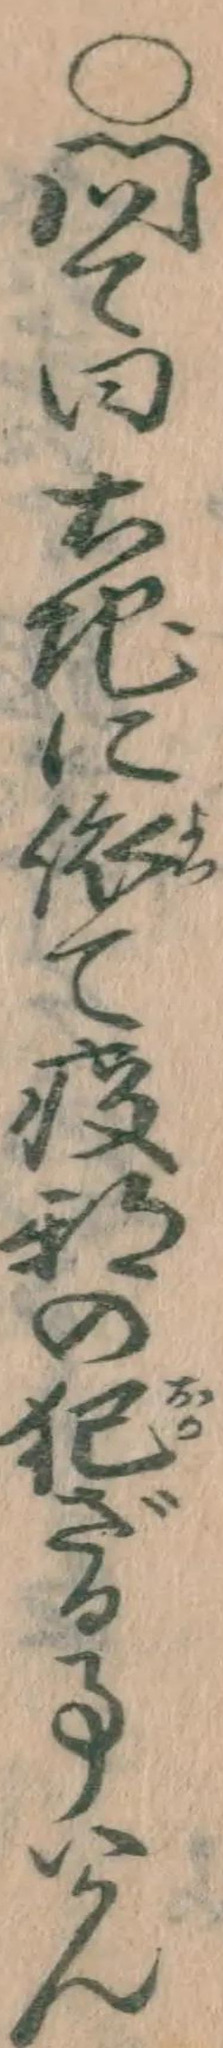○問て曰土地に依て疫邪の犯ざる事いかん
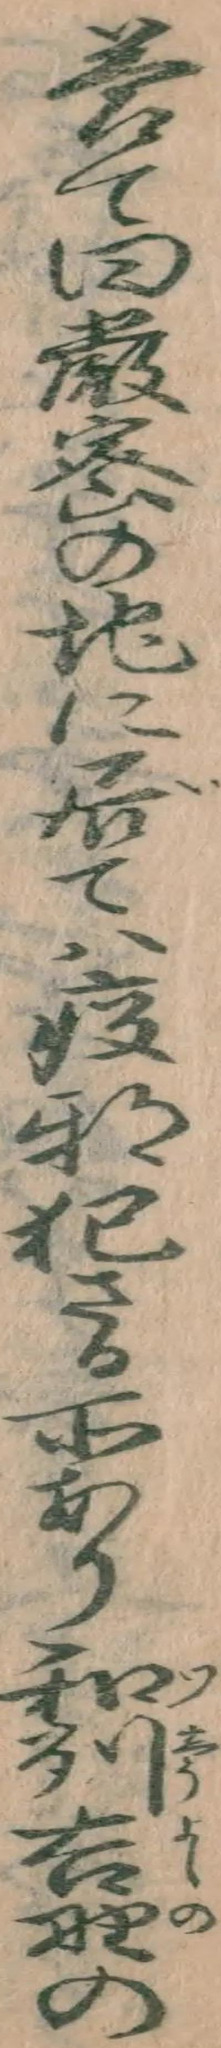答て曰厳密の地に居ては疫邪犯さる所あり和州吉野の
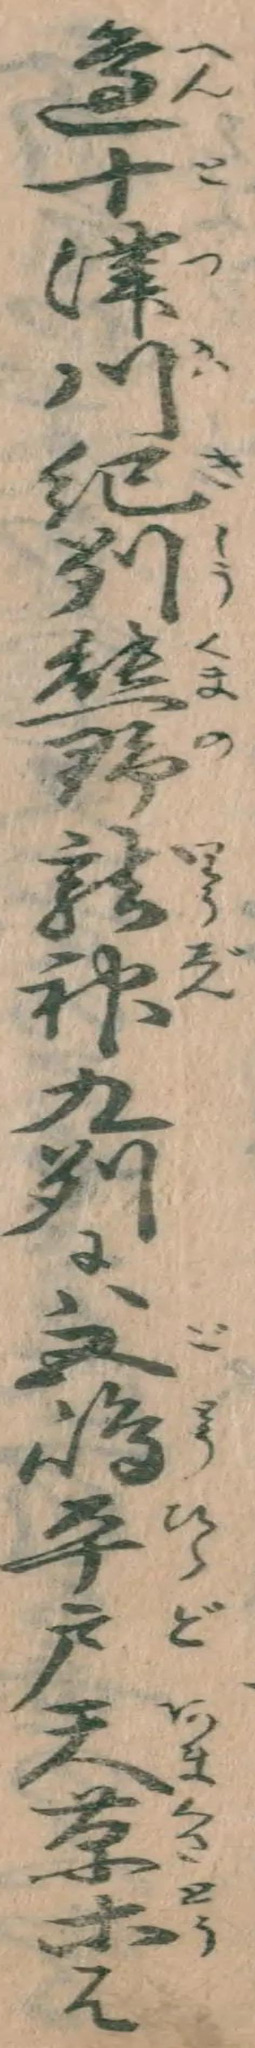辺十津川紀州熊野龍神九州には五嶋平戸天草等は
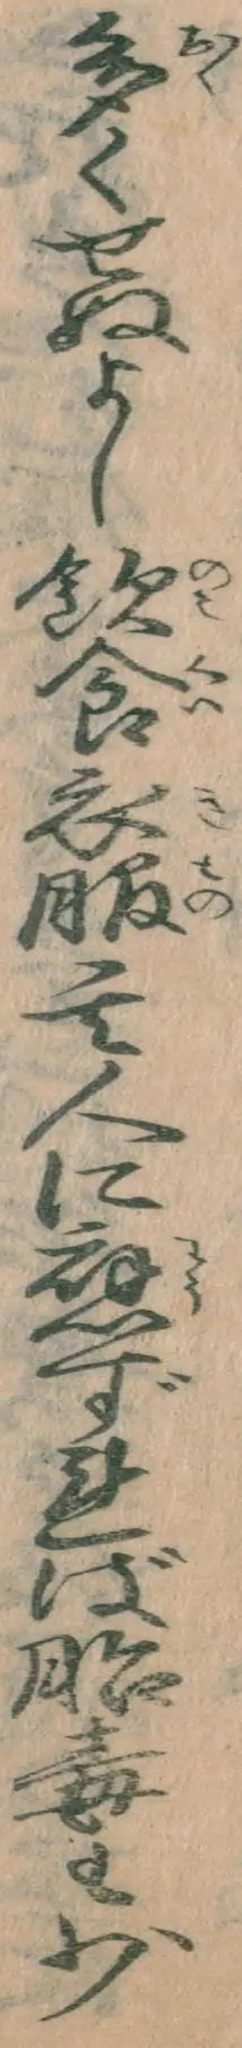多くせぬよし飲食衣服其人に応ずれば胎毒も少

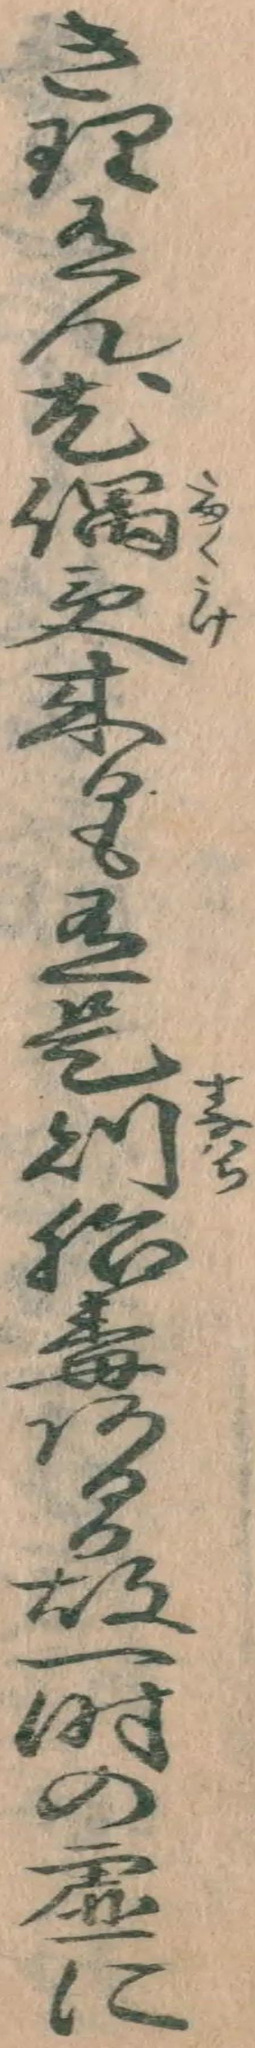き理有ん尤偶受来るも有是則胎毒あるか故一時の虚に
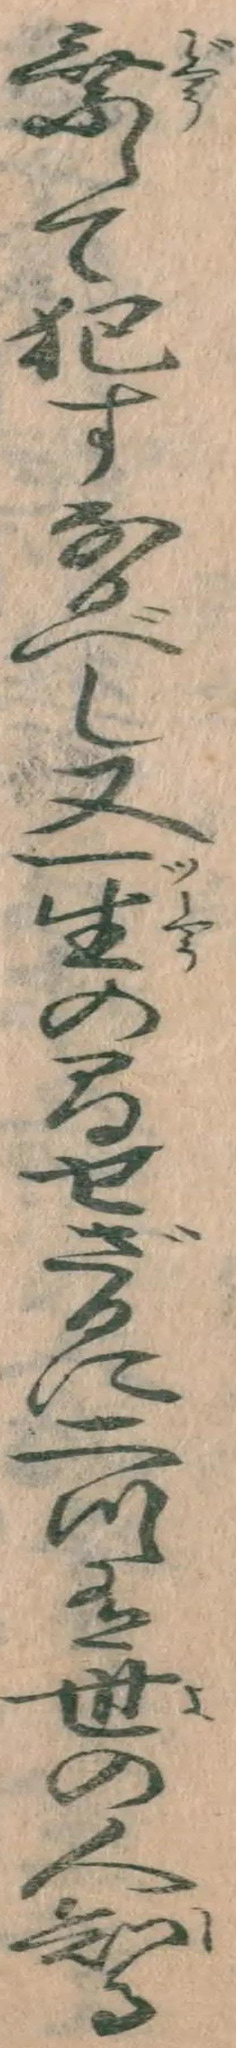乗して犯すなるべし又一ッ生の間せざるに二つ有世の人知る
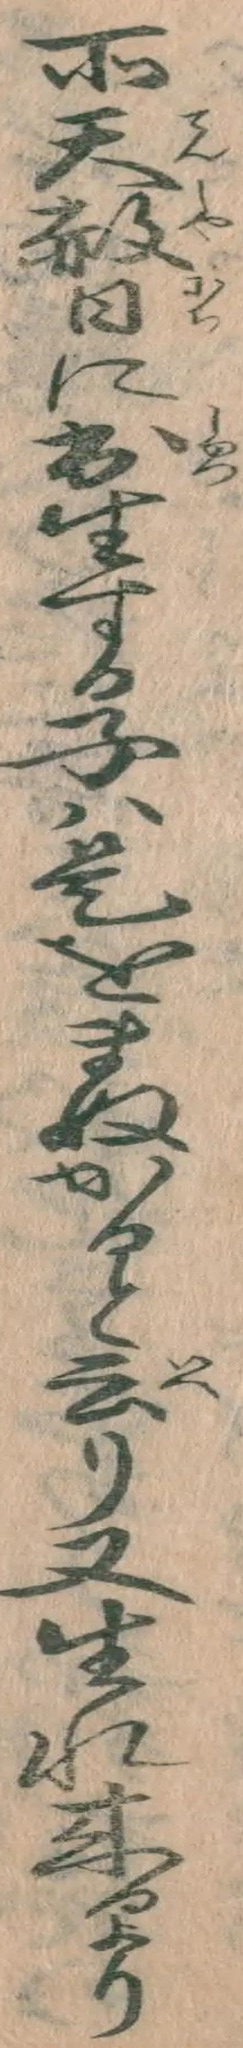所天赦日に出生する子は是をまぬかると云り又生れ来るより
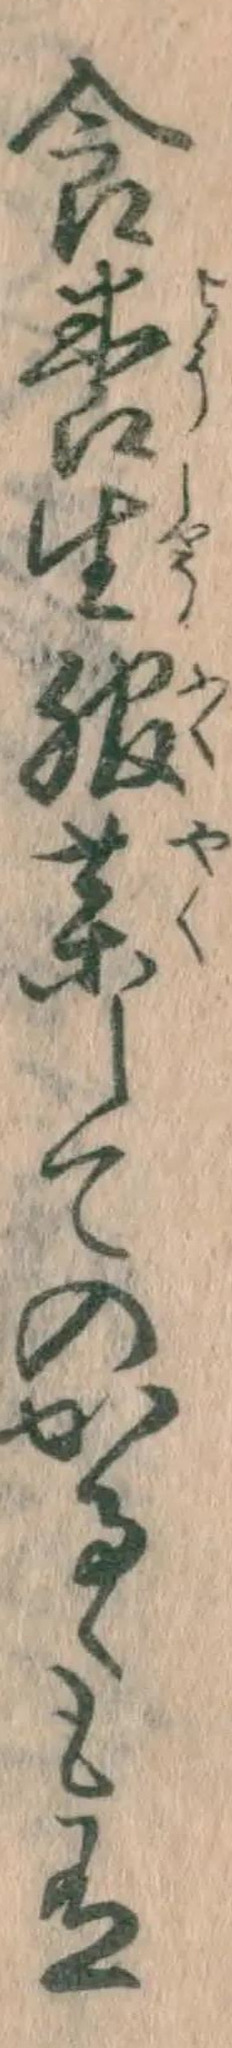食養生服薬してのかるゝも有
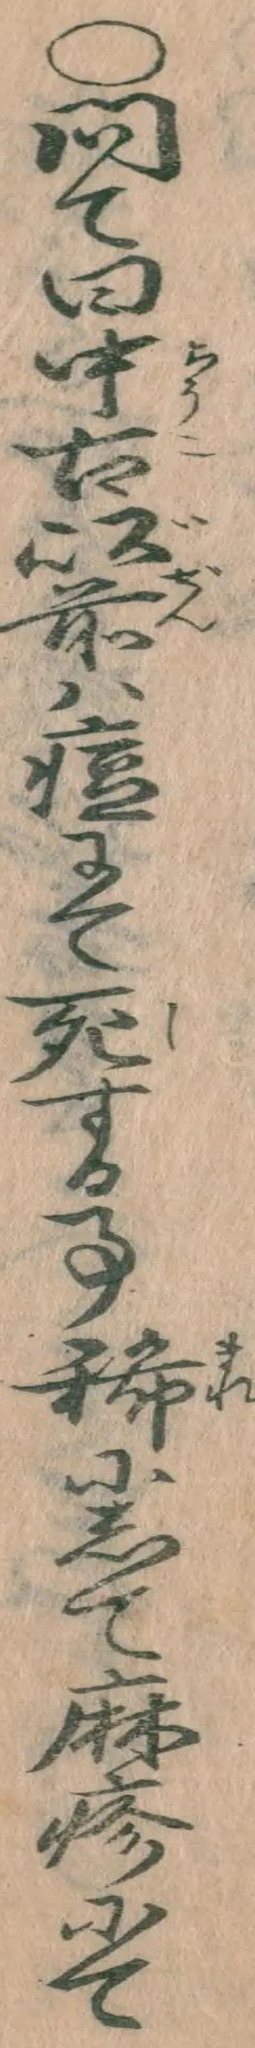○問て曰中古以前は痘にて死する事稀にして麻疹にて
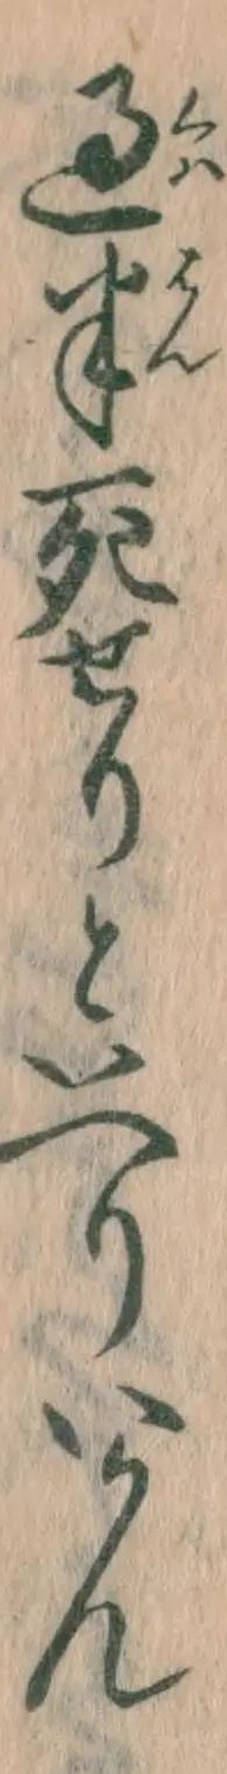過半死せりといへりいかん
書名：痘家初心問答
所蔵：国立国会図書館 National Diet Library, JAPAN
